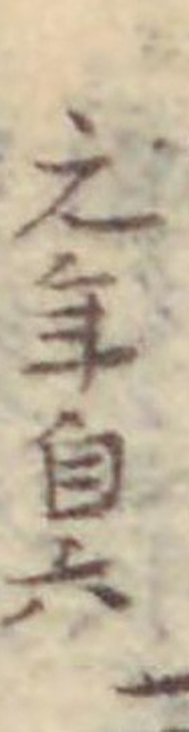元年自六
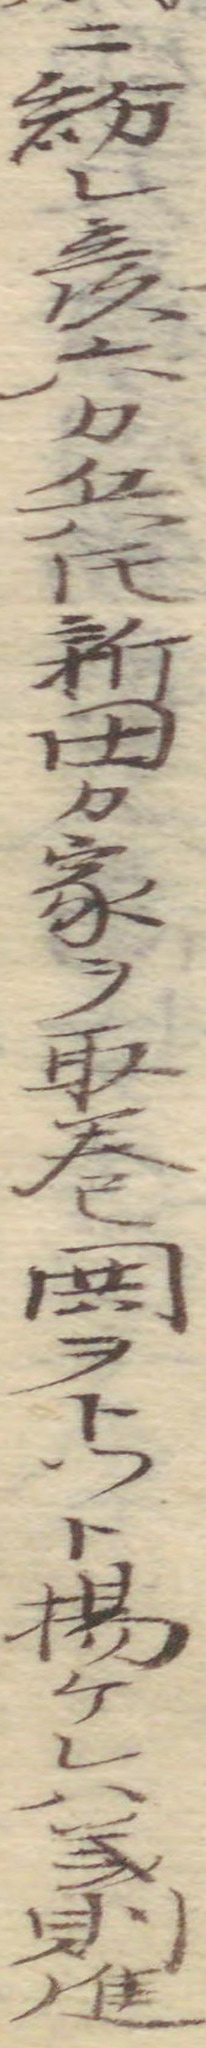ニ紛レ彦六カ兵トモ新田カ家ヲ取巻鬨ヲトツト揚ケレハ義則進
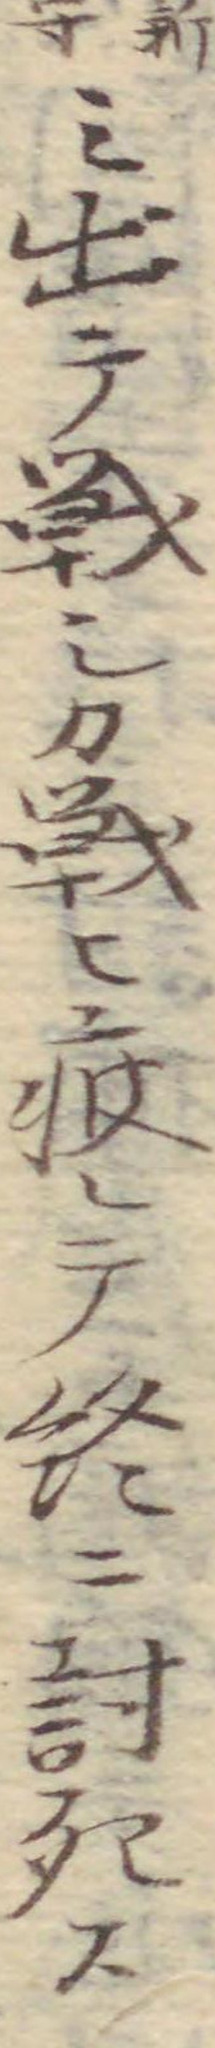ミ出テ戦シカ戦ヒ疲レテ終ニ討死ス
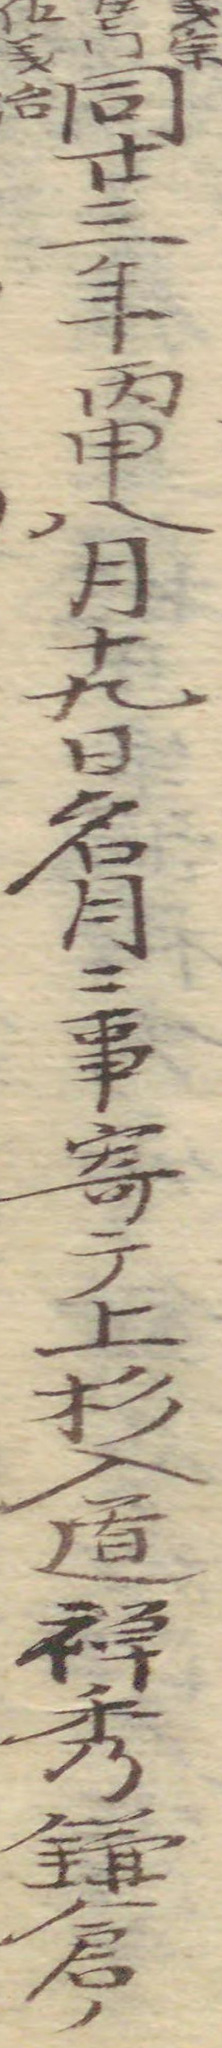同廿三年丙申八月十九日名月ニ事寄テ上杉入道禅秀鎌倉ノ
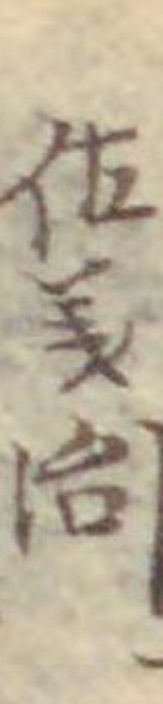佐義治
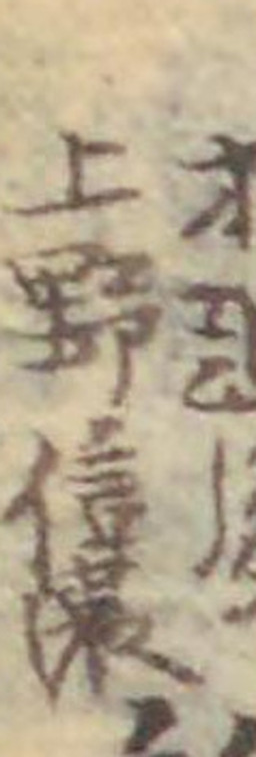上野信濃
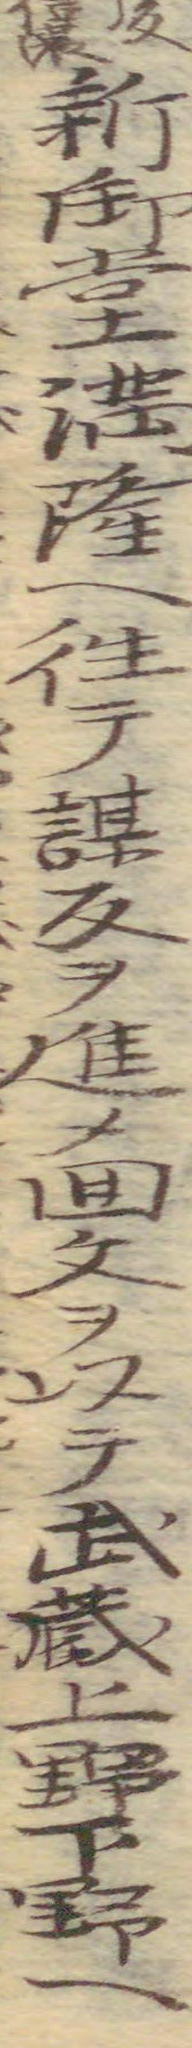新御堂満隆ヘ往テ謀反ヲ進メ回文ヲ以テ武蔵上野下野ヘ

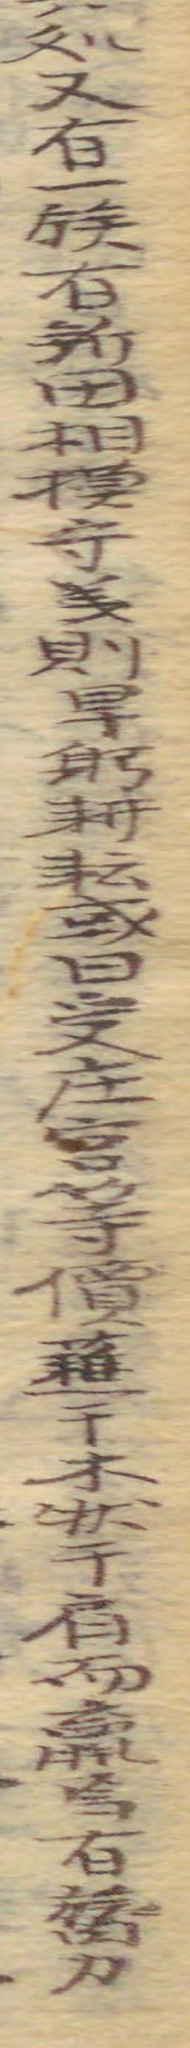其処又有一族有新田相模守義則旱躬耕耘或曰受庄宮等価䕴于木状于肩而臝為有膐力
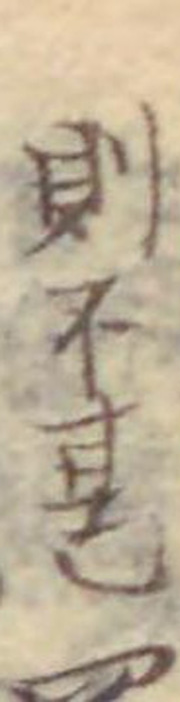則不甚
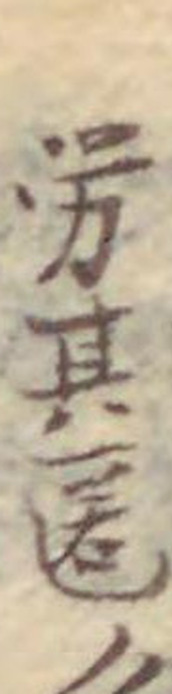労其匿
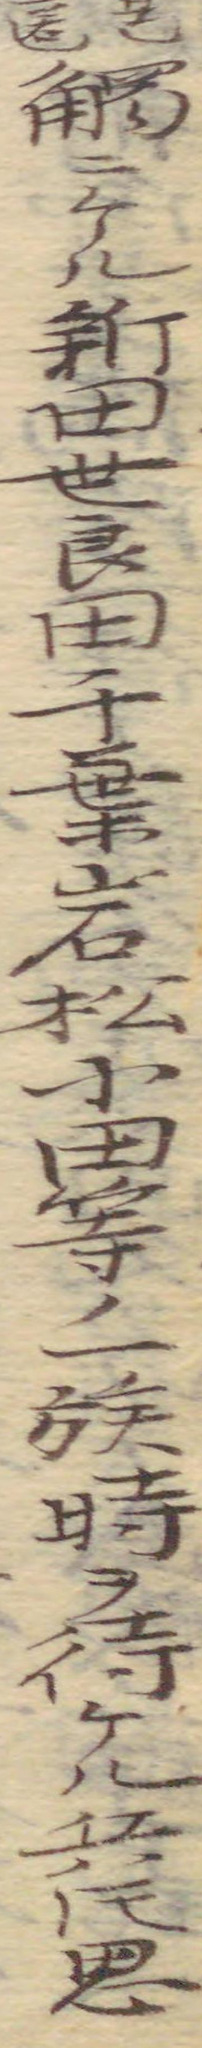触ニケル新田世良田千葉岩松小田等ノ一族時ヲ待ケル兵トモ思
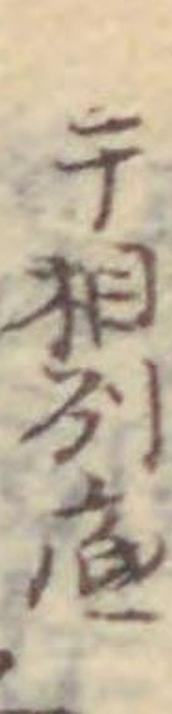于相州底
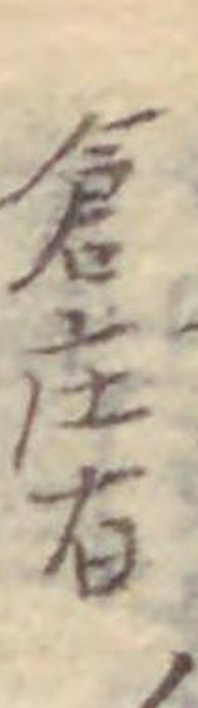倉庄有
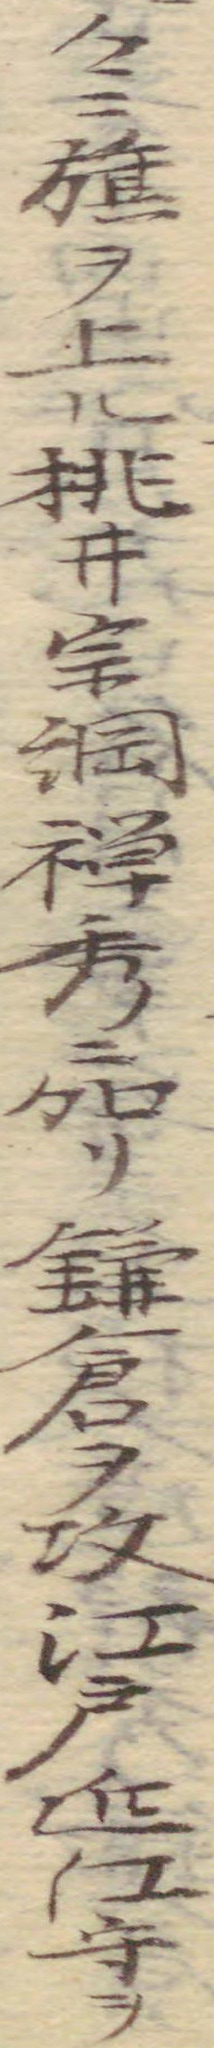々ニ旗ヲ上ル桃井宗綱禅秀ニ加リ鎌倉ヲ攻江戸近江守ヲ
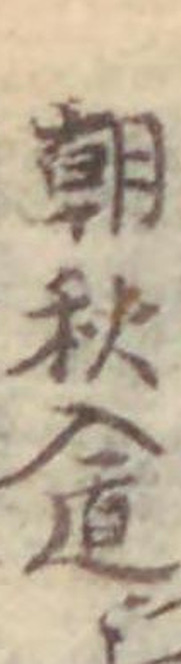朝秋入道
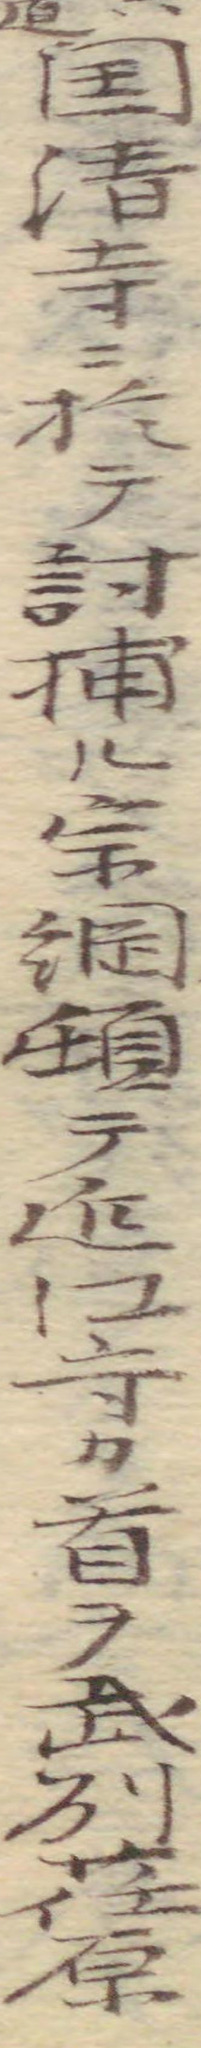国清寺ニ於テ討捕ル宗綱頓テ近江守カ首ヲ武州荏原
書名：鶯宿雑記. 巻199-200
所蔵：国立国会図書館 National Diet Library, JAPAN
